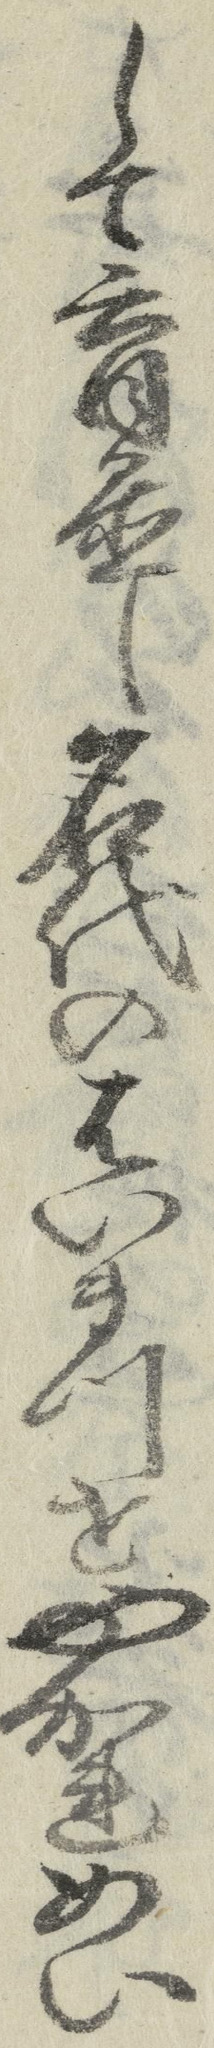して育置し名代のはいまつをやかれめい
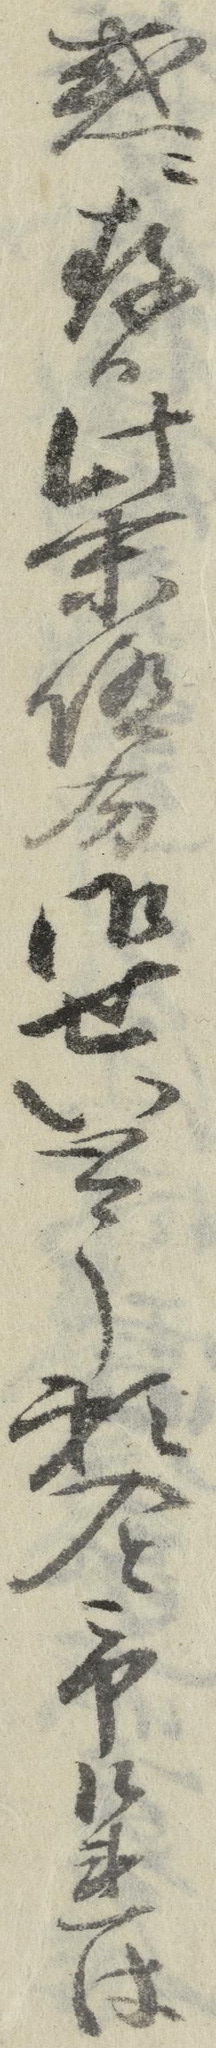惑に存候此末隋分御せい思う頼入と被申けれは

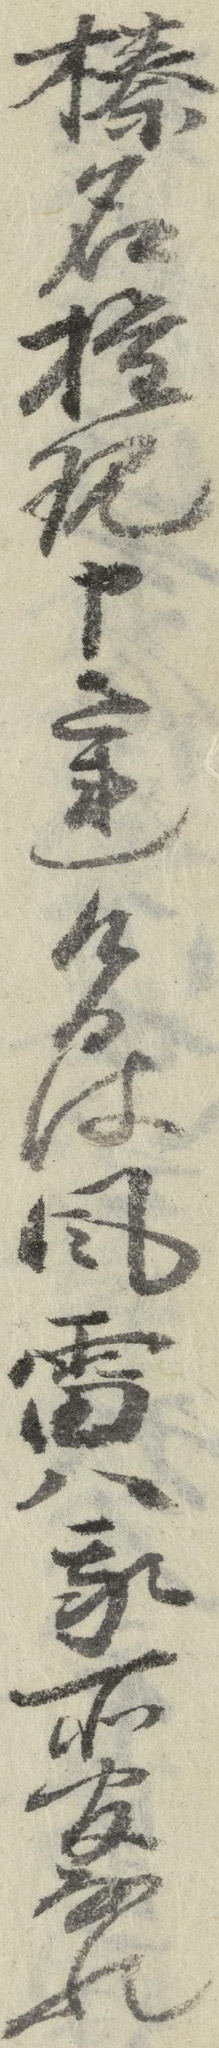榛名権現申され候而は風雷は我所官なれ
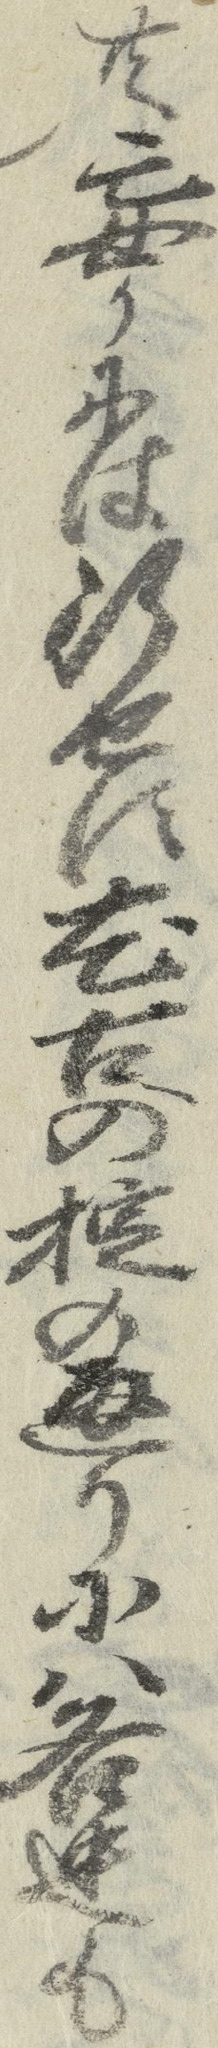者妄りには行セす尤古の掟の通りには各迚も
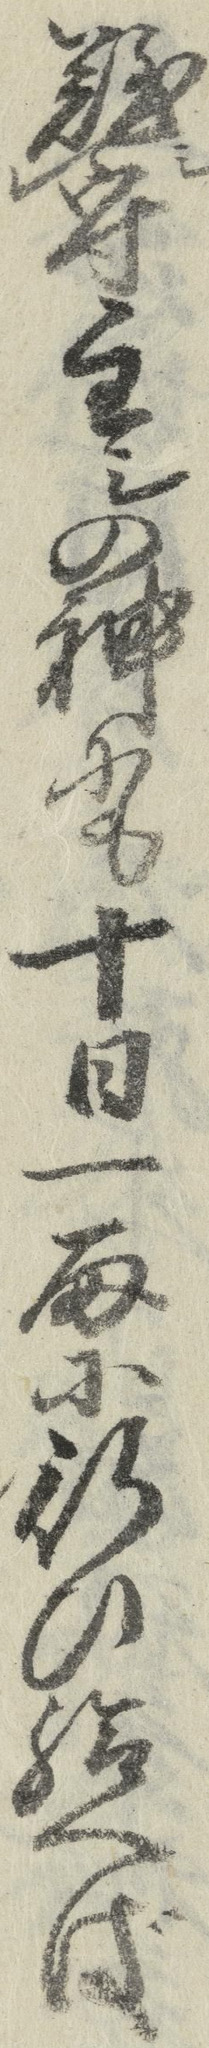難守主シの神にも十日一雨に行ひ給へば
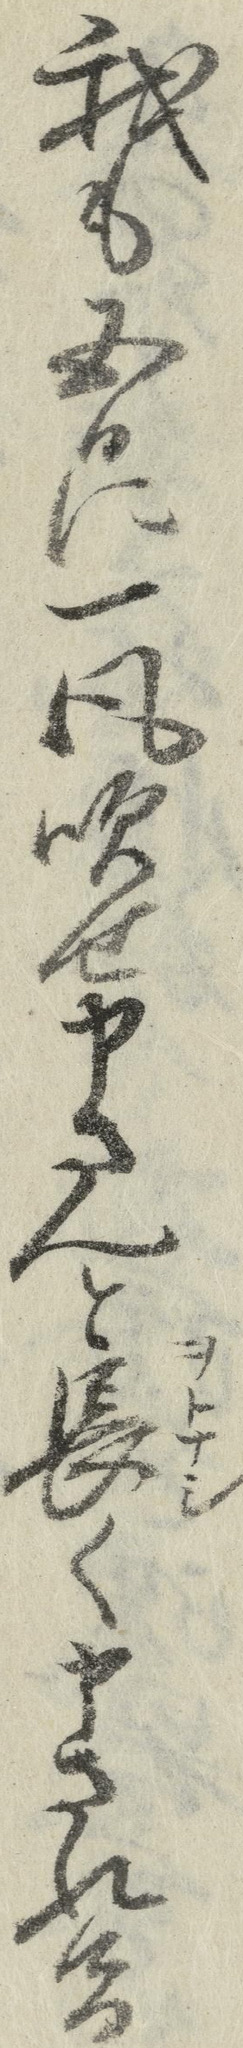我も五日に一風吹せ申さんと長く申されける
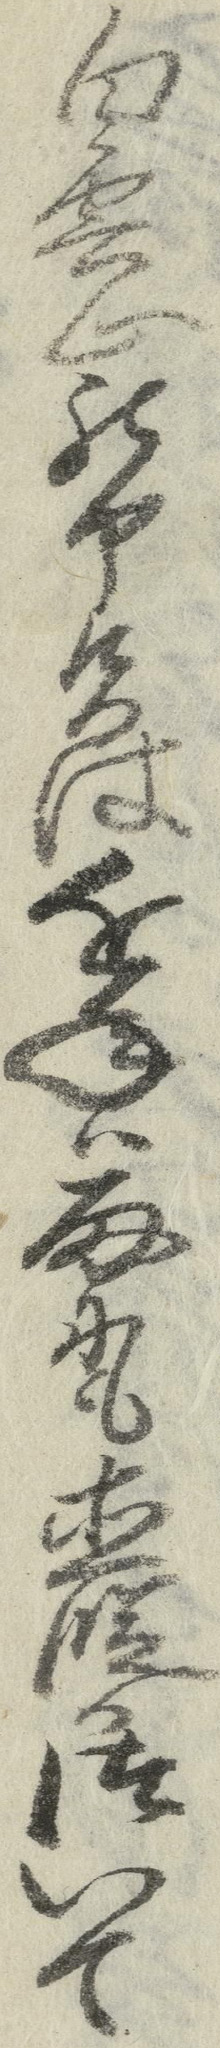白雲山被申けるは近年は雨にも直段かついて
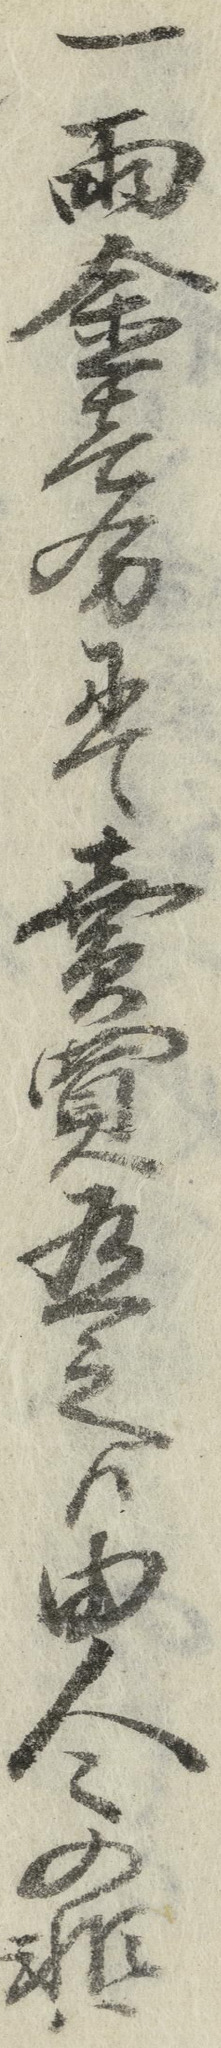一両金壱分にて売買有之候由人々の非は
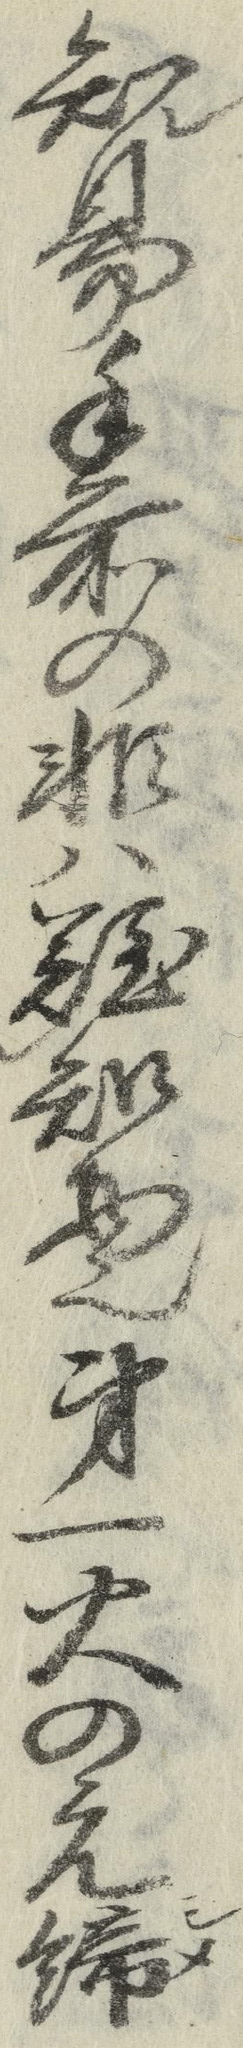知易手前の非ハ難知物之第一火の元締
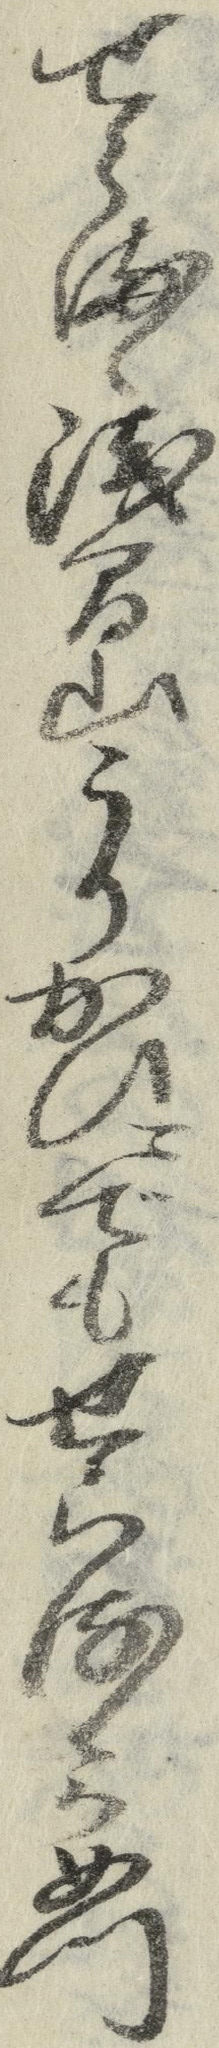せらるゝ浅間山うりかひにでもせらるゝかめつ
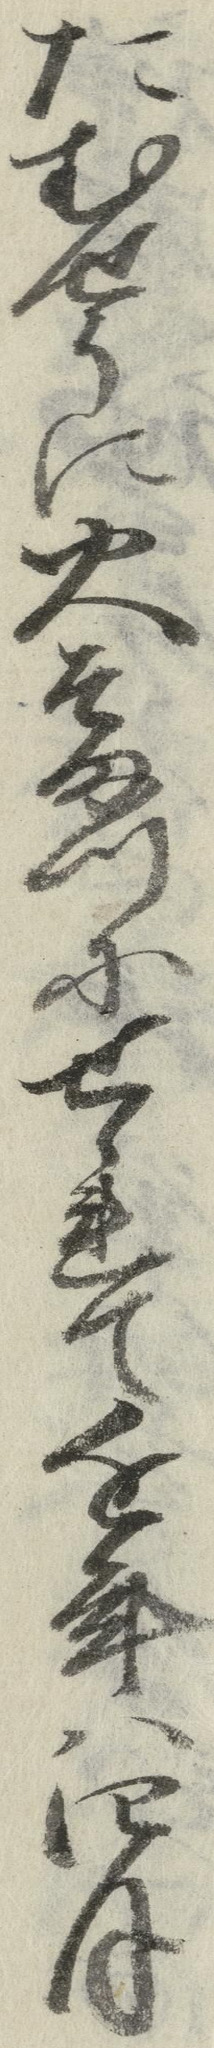たむせうに火そまつにせられて近年ハ四月
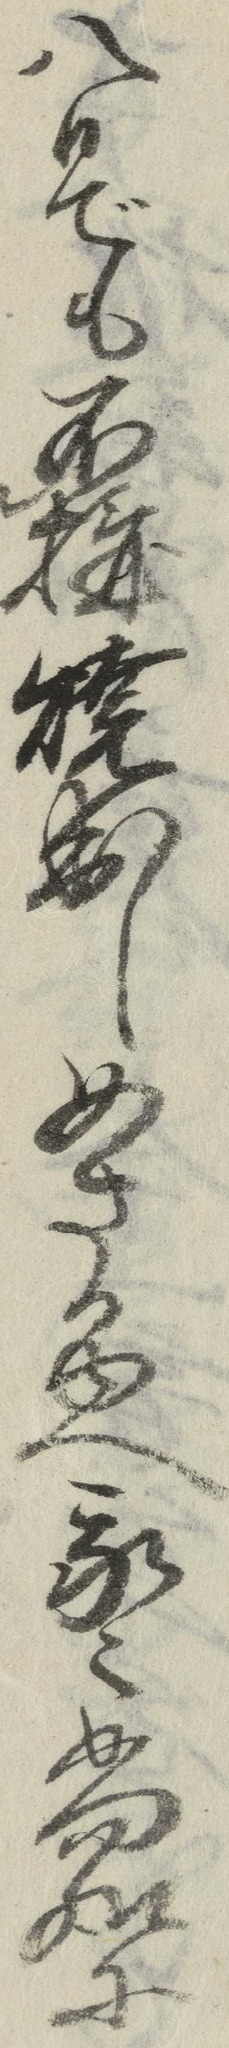八日でも不構焼出しめさるゆへ我々如何様に
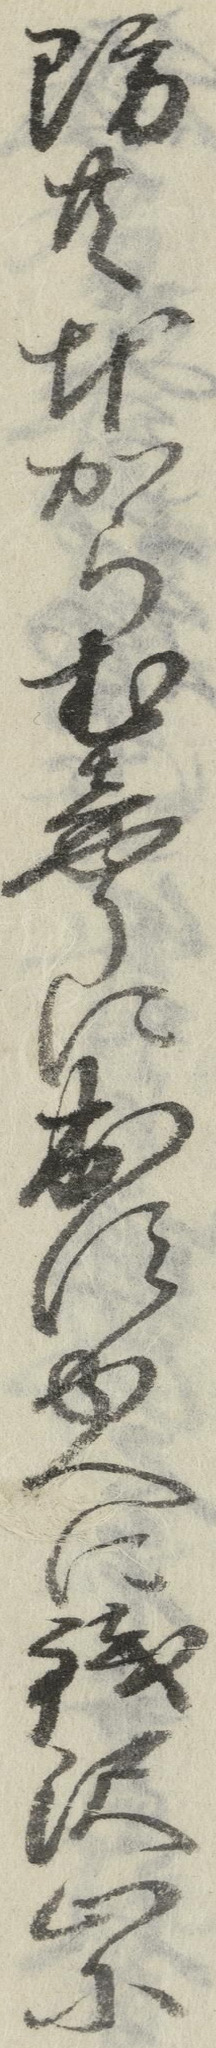防共本からむしやうに出すゆへに銭沢山に
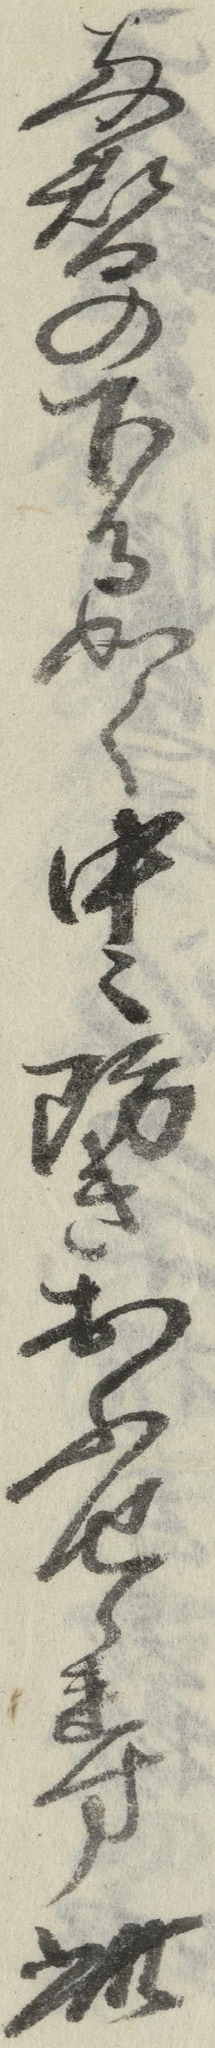両替の下る如く中々防きおふせられす此
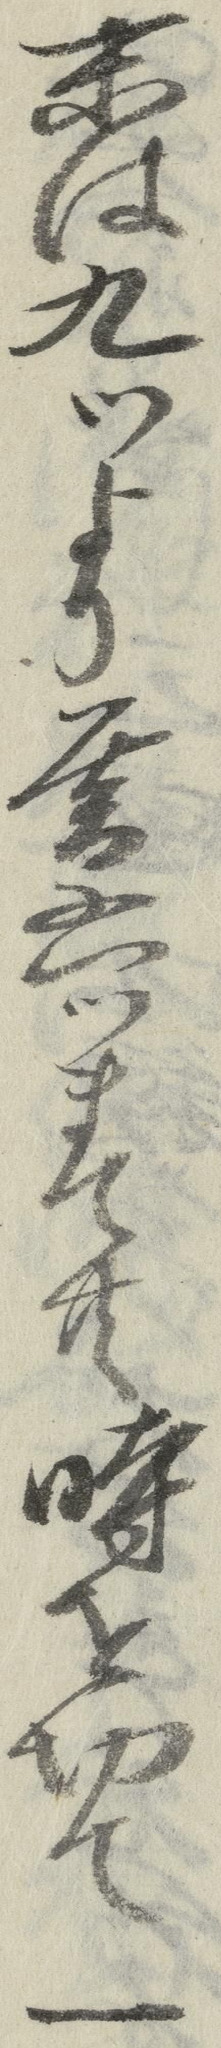末は九ツより暮六ツまて共時を切て一
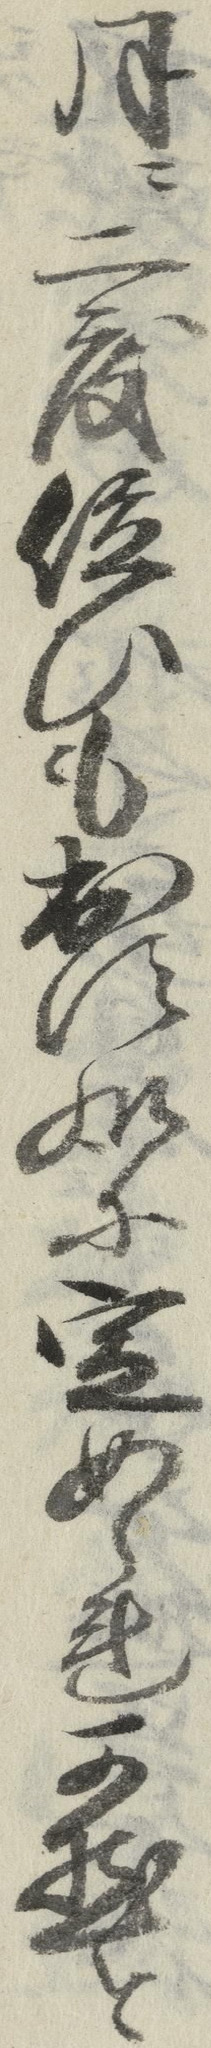月に二度位ひも出す様に定められ可然と
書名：浅間大焼騒動記　上
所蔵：東京大学地震研究所図書室 Earthquake Research Institute Library, The University of Tokyo, JAPAN
